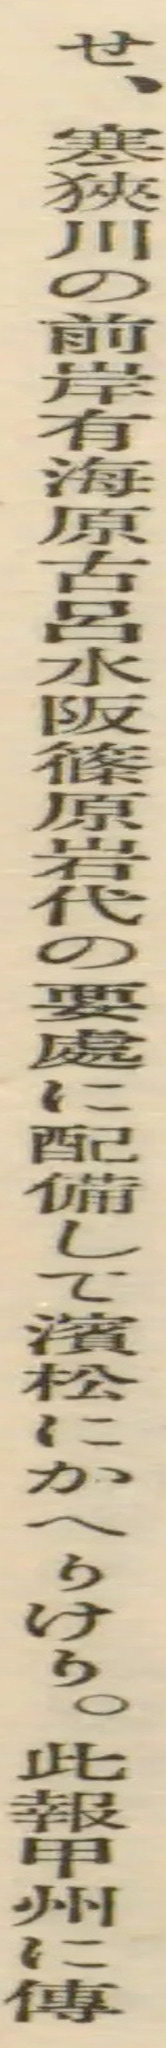せ、寒狭川の前岸有海原古呂水阪篠原岩代の要処に配備して浜松にかへりけり。此報甲州に伝

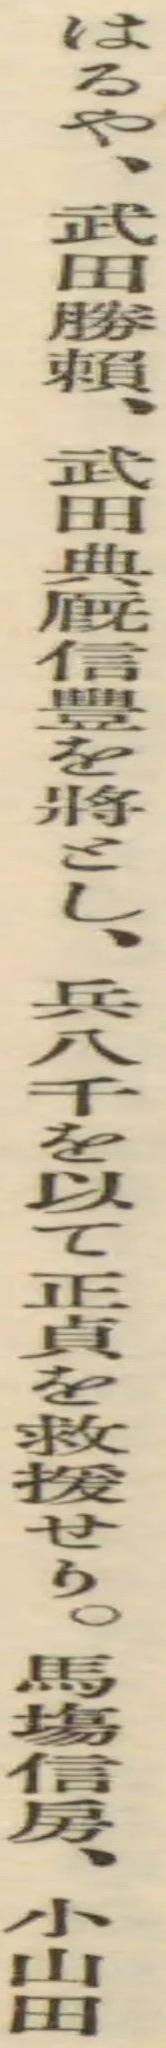はるや、武田勝頼、武田典厩信豊を将とし、兵八千を以て正貞を救援せり。馬場信房、小山田
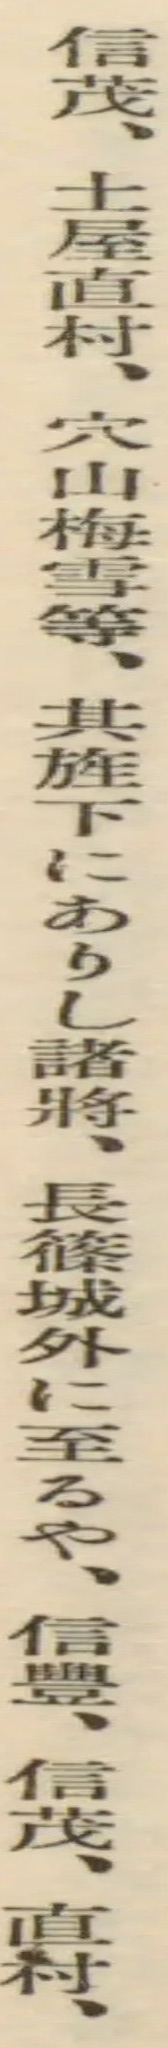信茂、土屋直村、穴山梅雪等、其旌下にありし諸将、長篠城外に至るや、信豊、信茂、直村、
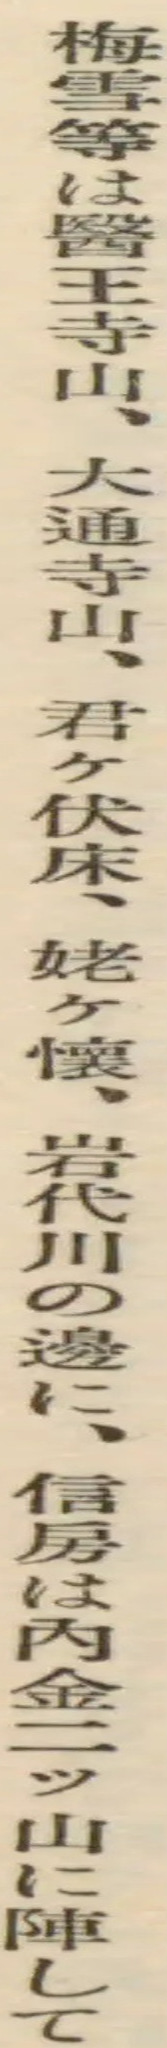梅雪等は医王寺山、大通寺山、君ケ伏床、姥ケ懐、岩代川の辺に、信房は内金二ツ山に陣して
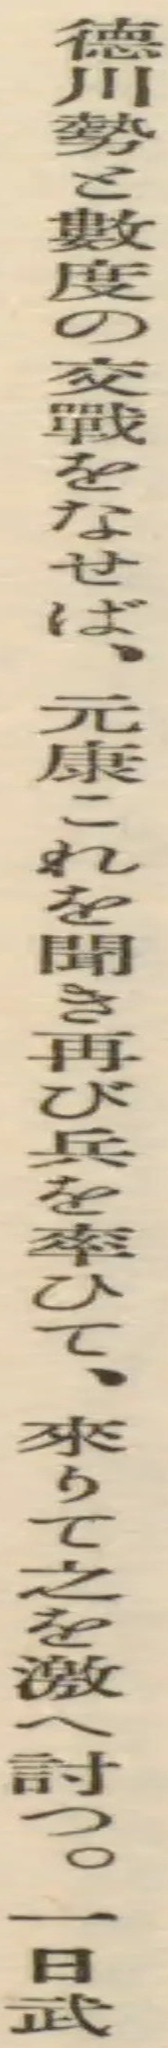徳川勢と数度の交戦をなせば、元康これを聞き再び兵を率いて、来りて之を激へ討つ。一日武
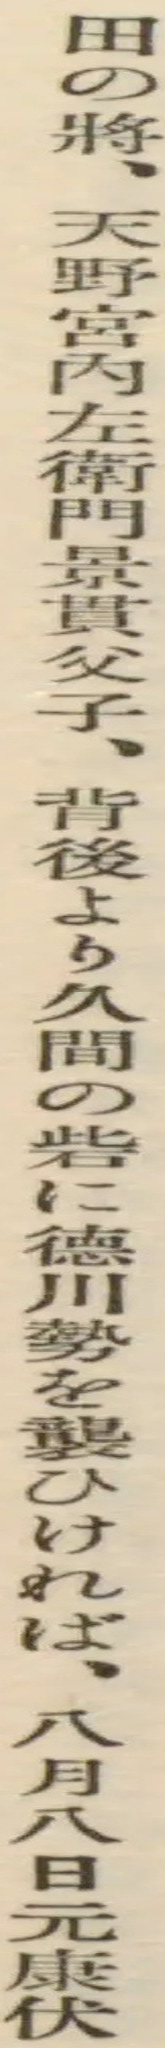田の将、天野宮内左衛門景貫父子、背後より久間の砦に徳川勢を襲ひければ、八月八日元康状
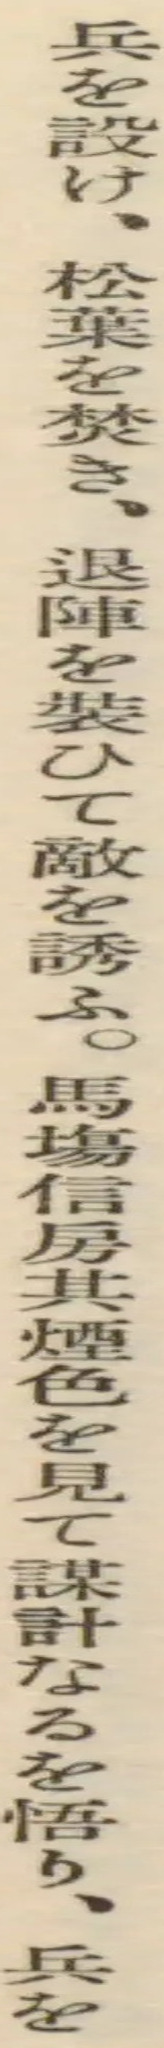兵を設け、松葉を焚き、退陣を装ひて敵を誘ふ。馬場信房其煙色を見て謀計なるを悟り、兵を
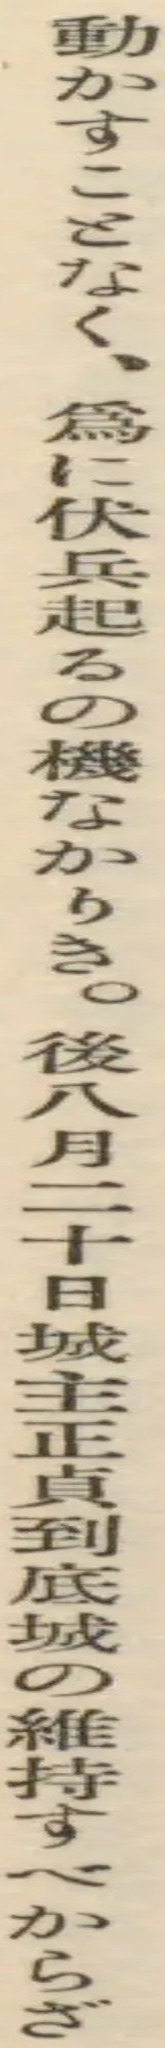動かすことなく、為に伏兵起るの機なかりき。後八月二十日城主正貞到底城の維持すべからざ
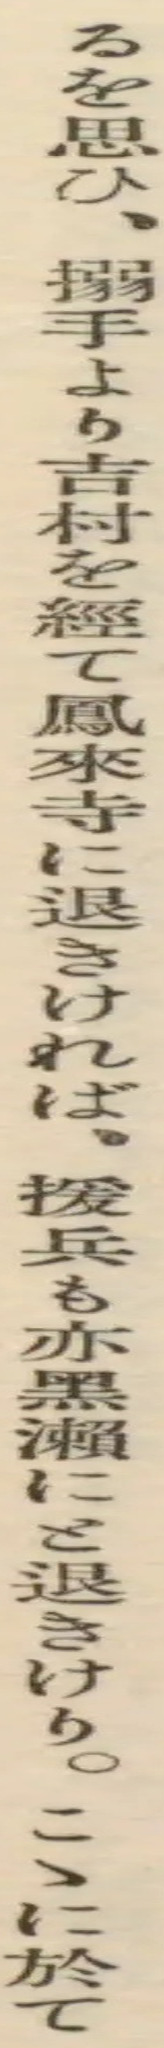るを思ひ、搦手より吉村を経て鳳来寺に退きければ、援兵も亦黒瀬にと退きけり。こゝに於て
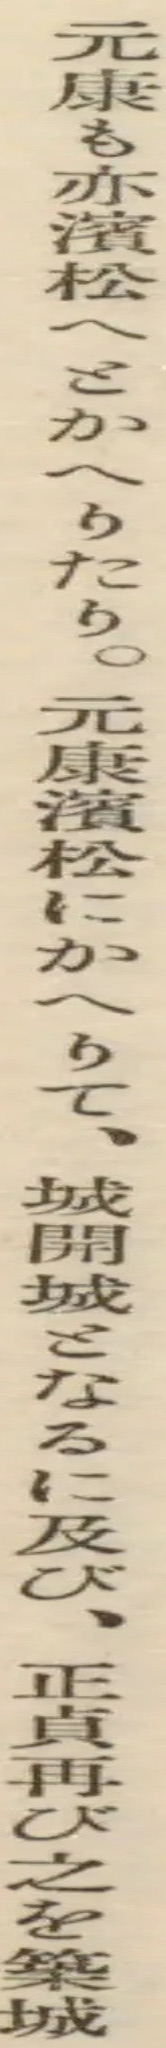元康も亦浜松へとかへりたり。元康浜松にかへりて、城開城となるに及び、正貞再び之を築城
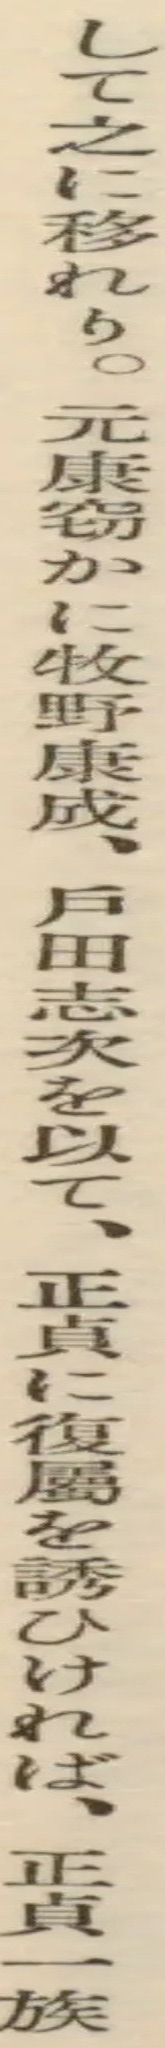して之に移れり。元康窃かに牧野康成、戸田志次を以て、正貞に復属を誘ひければ、正貞一族
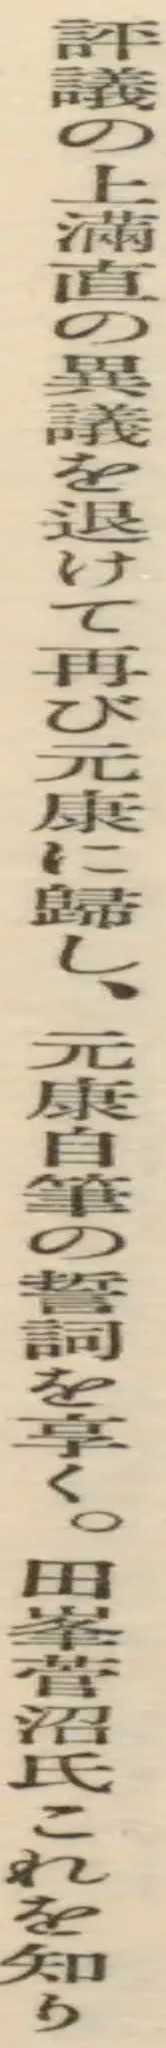評議の上満直の異議を退けて再び元康に帰し、元康自筆の誓詞を享く。田峯菅沼氏これを知り
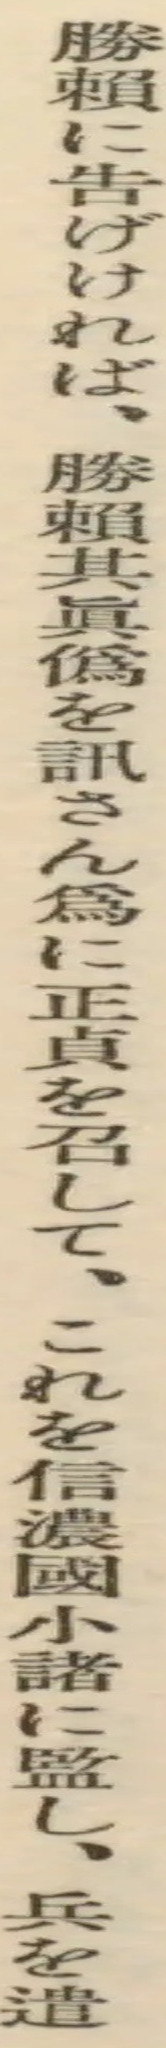勝頼に告げければ、勝頼其真偽を訊さん為に正貞を召して、これを信濃国小諸に監し、兵を遣
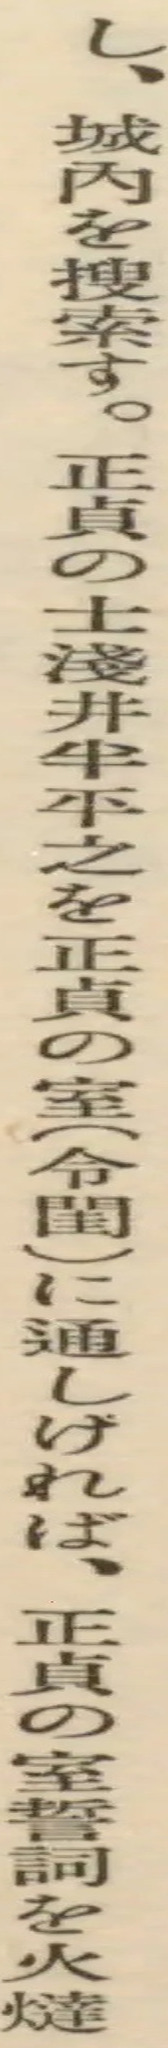し、城内を捜索す。正貞の士浅井半兵之を正貞の室(令閨)に通しければ、正貞の室誓詞を火燵
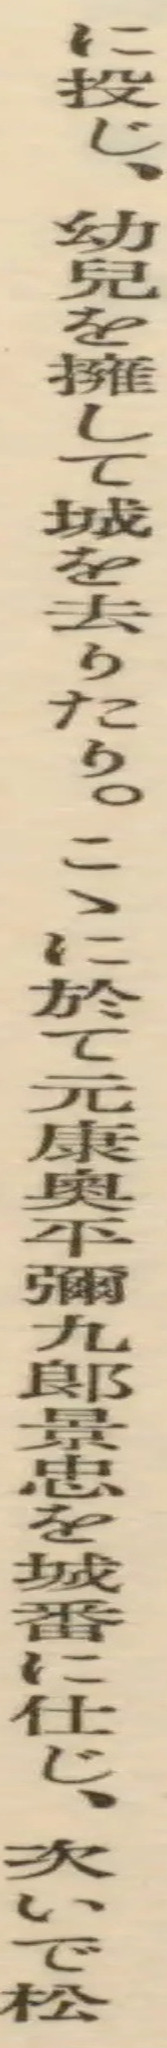に投じ、幼児を擁して城を去りたり。こゝに於て元康奥平弥九郎影忠を城番に仕じ、次いで松
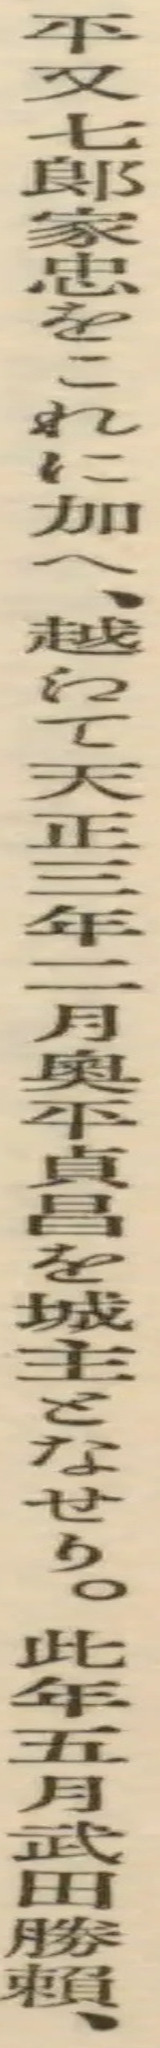平又七郎家忠をこれに加へ、越えて天正三年二月奥平貞昌を城主となせり。此年五月武田勝頼、
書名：東三河之古城
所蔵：国立国会図書館 National Diet Library, JAPAN
